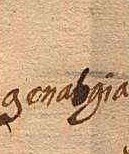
genalogia
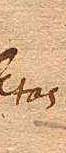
Etas
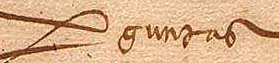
ꝑguntas
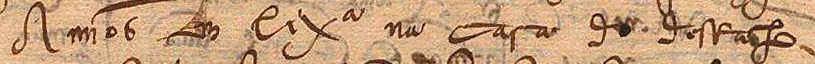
Annōs em lixa na Casa do despacho
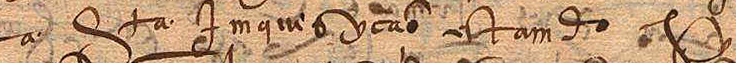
da Sta Jmquisyçaõ estamdo hy
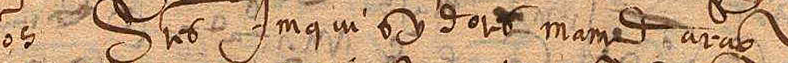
os Sr̄es Jmquisydores mamdaraõ
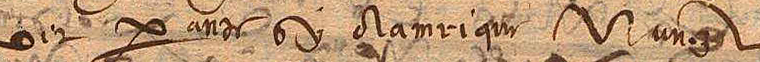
vir ꝑante sy A amrique Nun̄ez
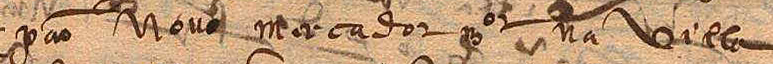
Xpão Nouo mercador mor na Villa
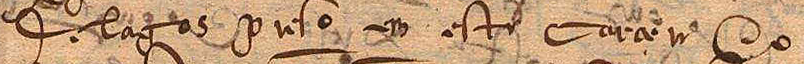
de lagos preso em este Carcere e o
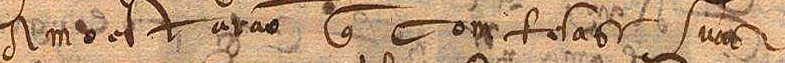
Amoestarão q̄ Comfesase Suas
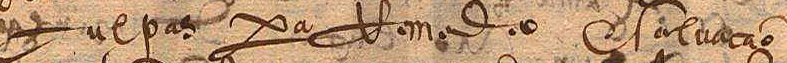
Culpas ꝑa Remedeo e saluaçaõ
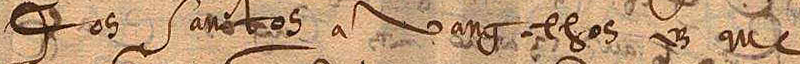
dos Sanctos avangelhos em que
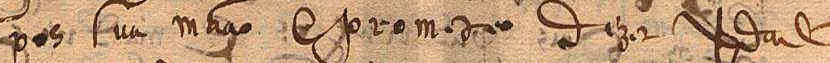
pos sua mãao e prometeo dizer Ꝟdade
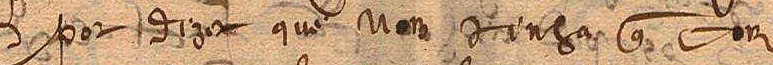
e por dizer que nom tinha q̄ Com
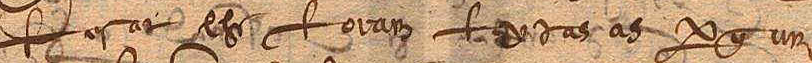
fesar lhe foram feytas as ꝑgum
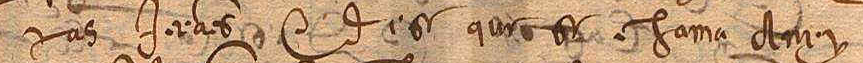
tas Jerāes e dise que se chama Anry
